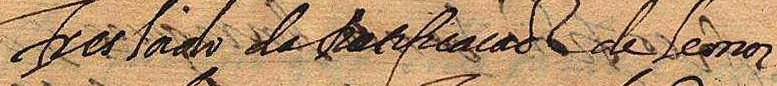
Treslado da Ratificaçaõ de Leonor
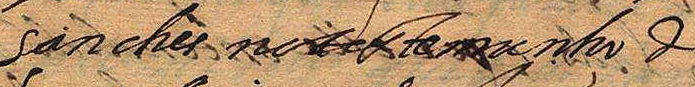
sanches no testemunho de
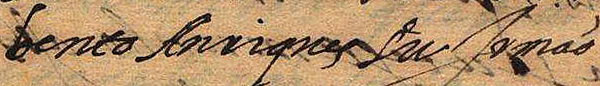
bento Anriques seu Jrmaõ
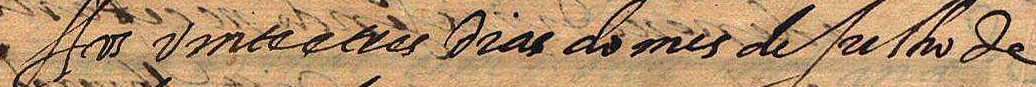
Aos vinte e tres dias do mes de Julho de
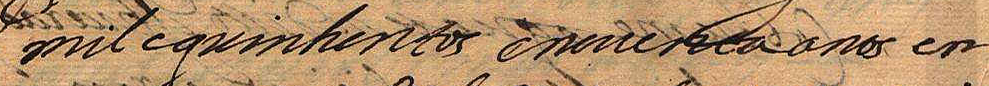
mil e quinhentos e nouenta anos em
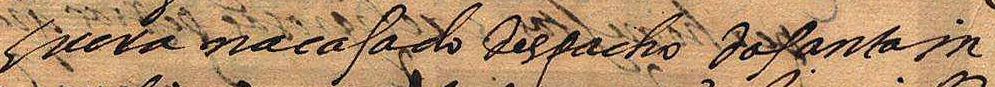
Euora na casa do despacho da santa in
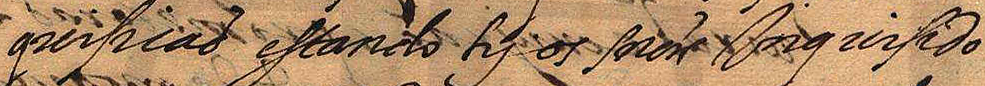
quisiçaõ estando hj os snors̄ Inquisido
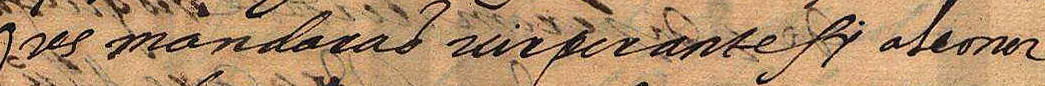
res mandaraõ uir perante sy a Leonor
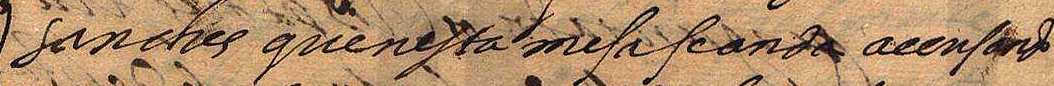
sanches que nesta mesa se anda acusando
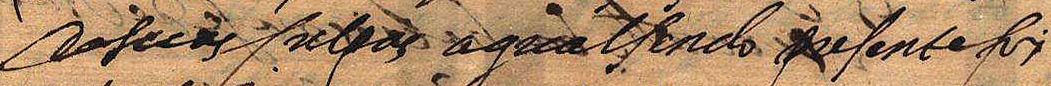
de suas Culpas a qual sendo presente foy
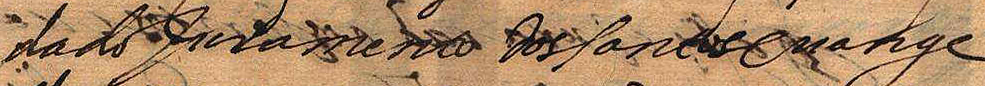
dado Juramento dos santos euange
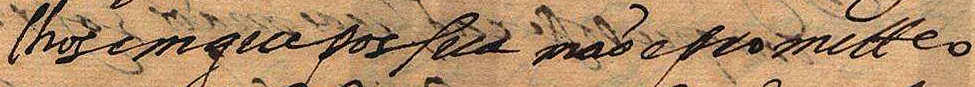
lhos em que pos sua maõ e prometteo
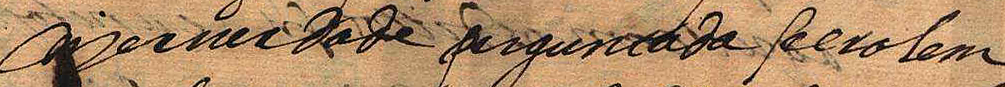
dizer uerdade perguntada se era lem
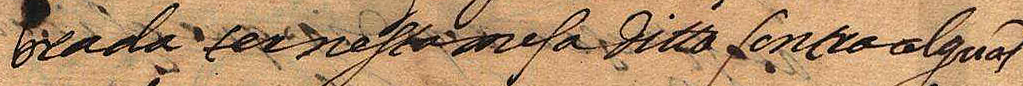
brada ter nesta mesa ditto Contra alguās
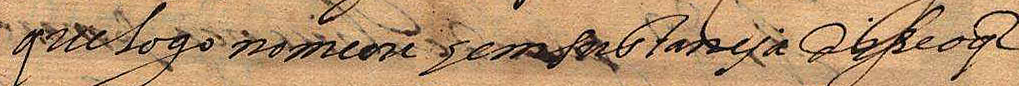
que logo nomeou E sem sustancja disse o q̄
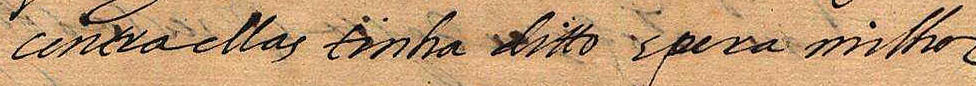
contra ellas tinha ditto E pera milhor
